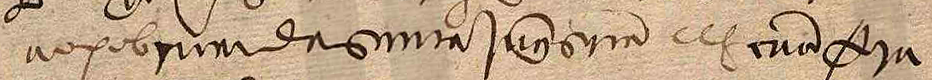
ao pobricar da santa Jnq̄syçā e lhe nā fora
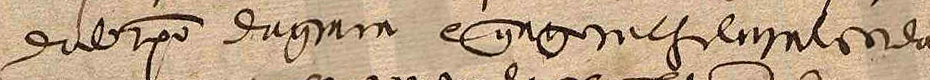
dado t̄po da graça e q̄ agora lhe deuja de ser da
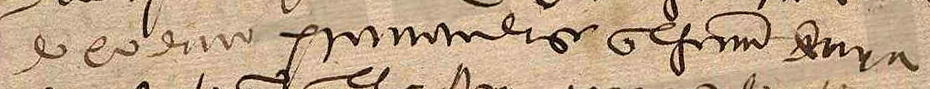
do e o dicto promotor dise q̄ lhe nā deuya
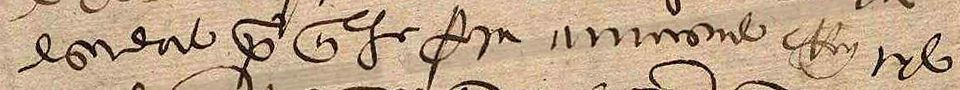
de ser dado p̄oq̄ lhe fora amoestado e Req̄rydo
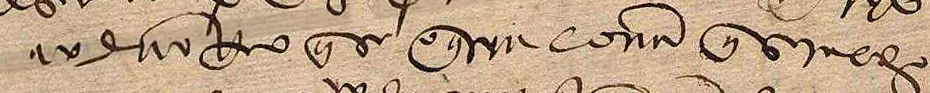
ao dito Reo q̄ se o q̄rya e o nā q̄sera e djo
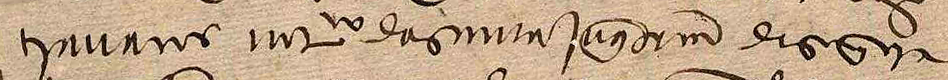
trauaços notro da santa Jnq̄syçā dise q̄ era
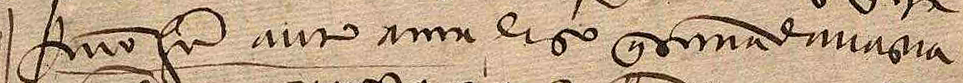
fect̄o hū auto ante diso q̄ se mādaua sua
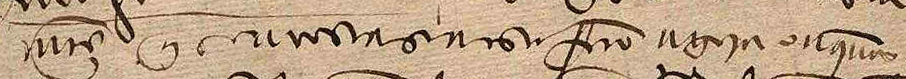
m̄ce q̄ se acostase a este fct̄o agora ou quan
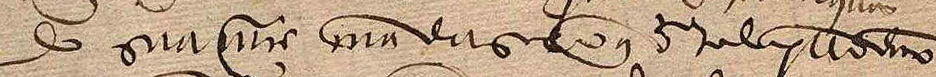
do sua m̄ce mādase e o q̄ vto todo p̄llo dito
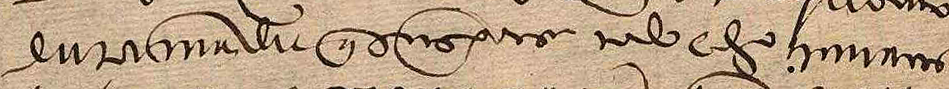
doutor mādou q̄ se esp̄vese todo e djo trauaços
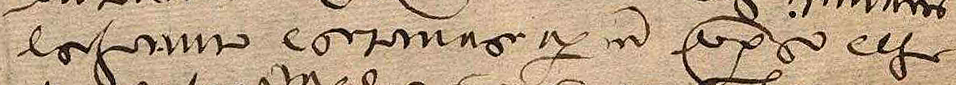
dese ho auto e se tornase a ꝑ çā do p̄so e lhe
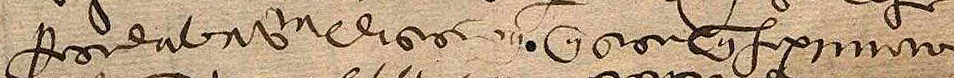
fose dado a vta e disese o q̄ q̄sese e q̄ ho promotor
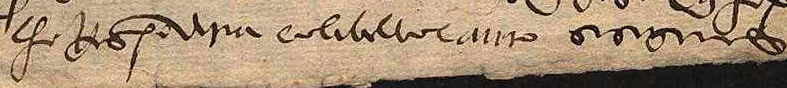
lhe Respōderia e o libello e auto se seguem
